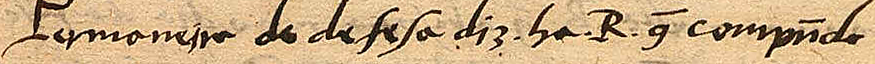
Per maneira de defesa diz ha .R. q̄ comprīdo
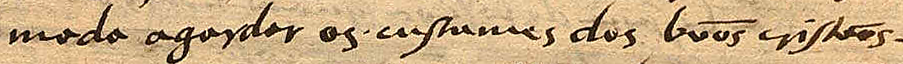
mada a gardar os custumes dos bōos cristaõs
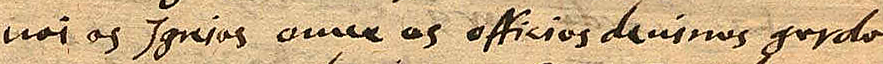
uai as Jgreias ouue os officios deuinos garda
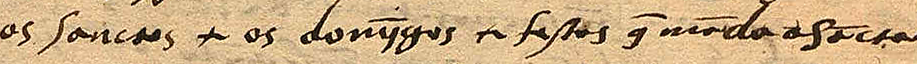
os sanctos e os domj̄gos e festas q̄ māda a Sācta
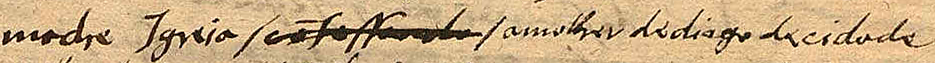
madre Jgreia / cōfessando / a molher de diogo de cidade
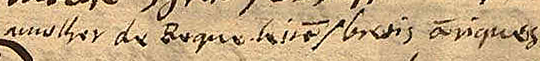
a molher de Roque leitā / bretis āriques
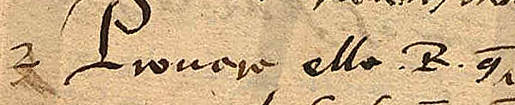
2 Prouara ella .R. q̄
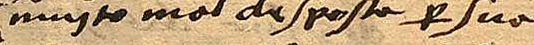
mujto mal desposta ꝑ sua
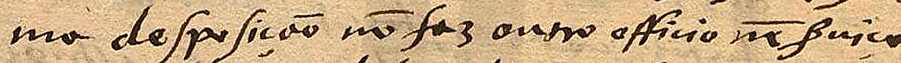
ma desposiçaõ nō faz outro officio nē ꞩuiço
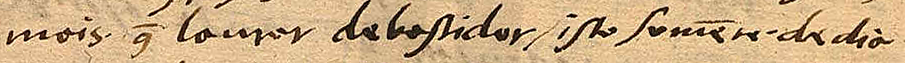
mais q̄ laurar de bastidor / isto somēte de dia
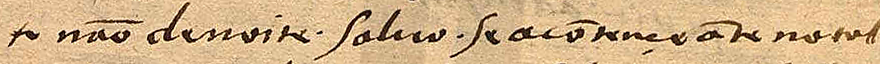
e não de noite. saluo se acōteçe ante no tal
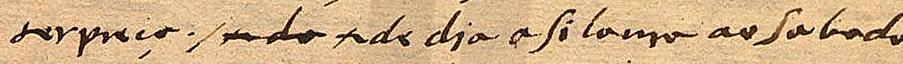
ter preça ./ e da e de dia asi laura ao sabado
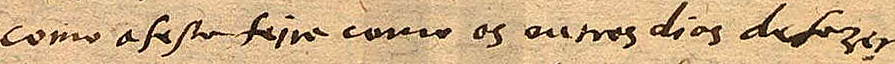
como a sesta fejra como os outros dias de fazer
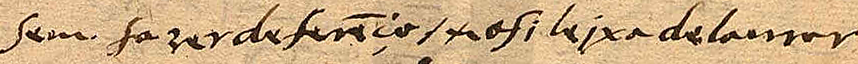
sem fazer deferēça / e asi lejxa de laurar
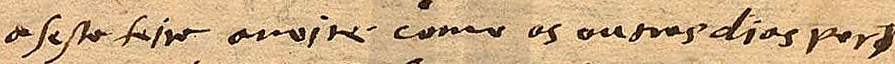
a sesta feira a noite. como os outros dias por q̄
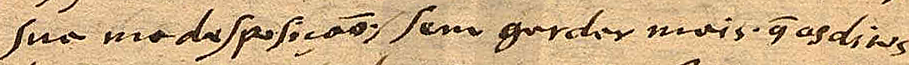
sua ma desposiçaõ ./ sem gardar mais. q̄ os ditos
